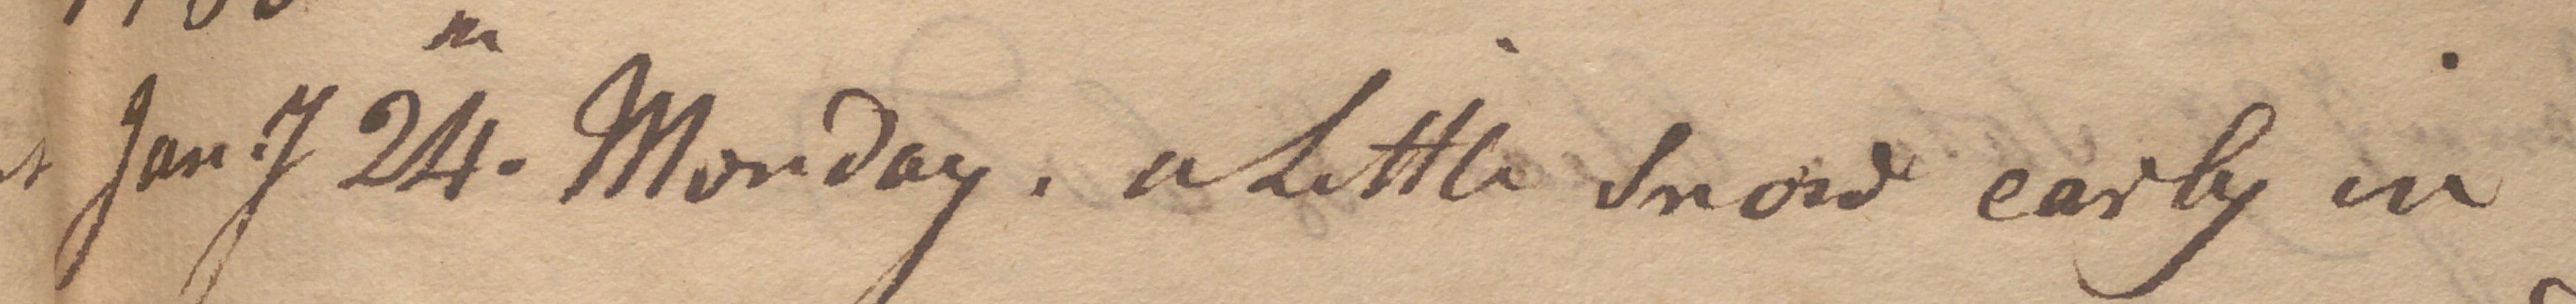Jan^y 24^th. Monday, a Little snow early in
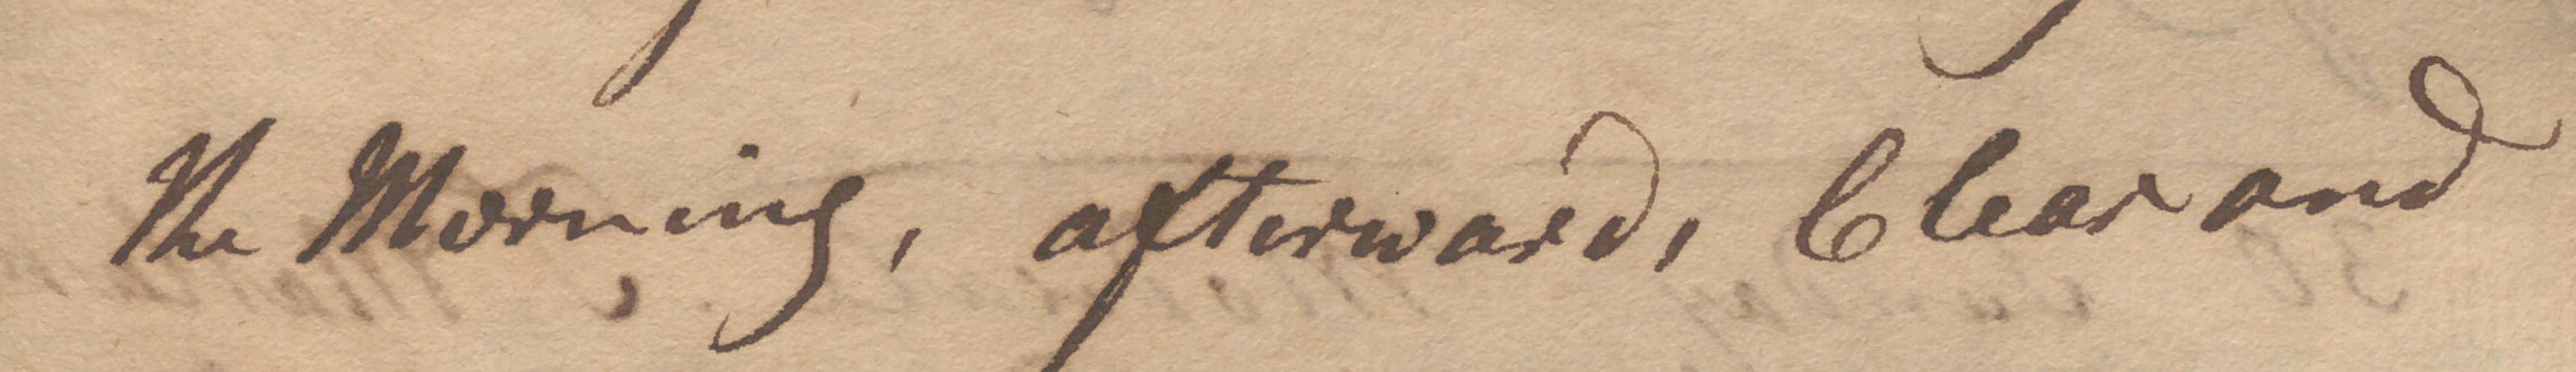the Morning, afterward, Clear and
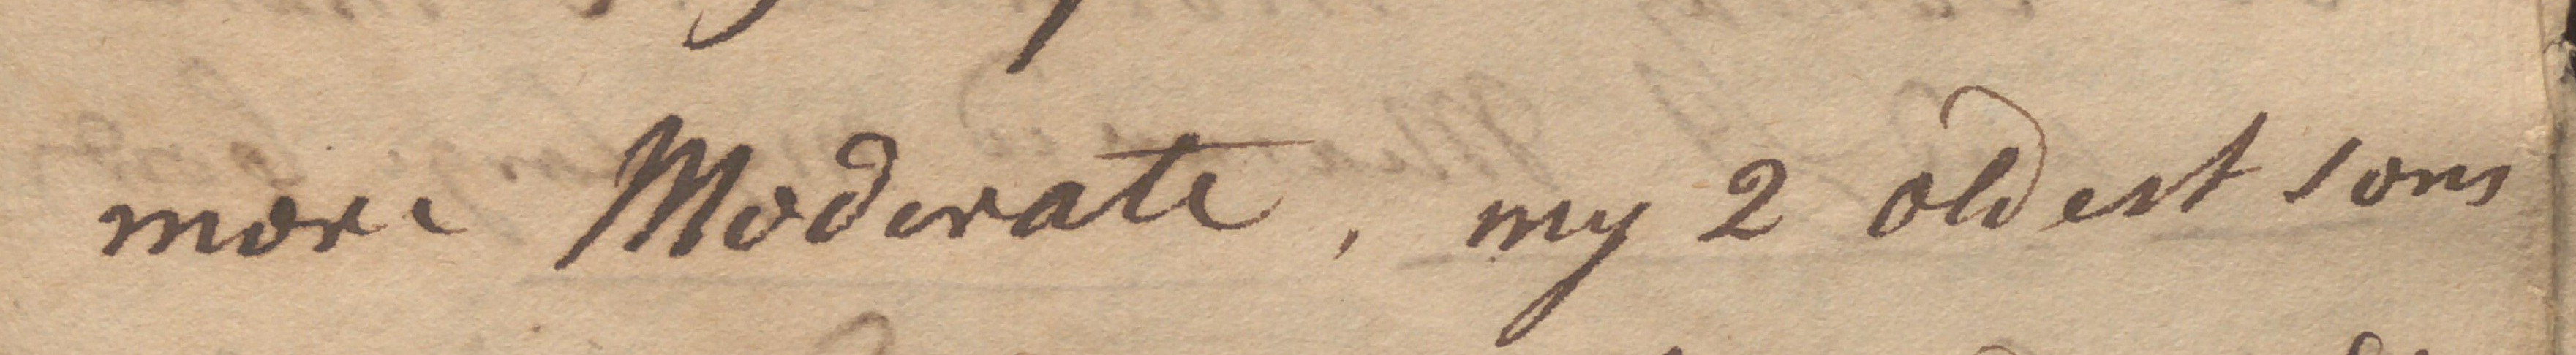more Moderate, my 2 oldest sons
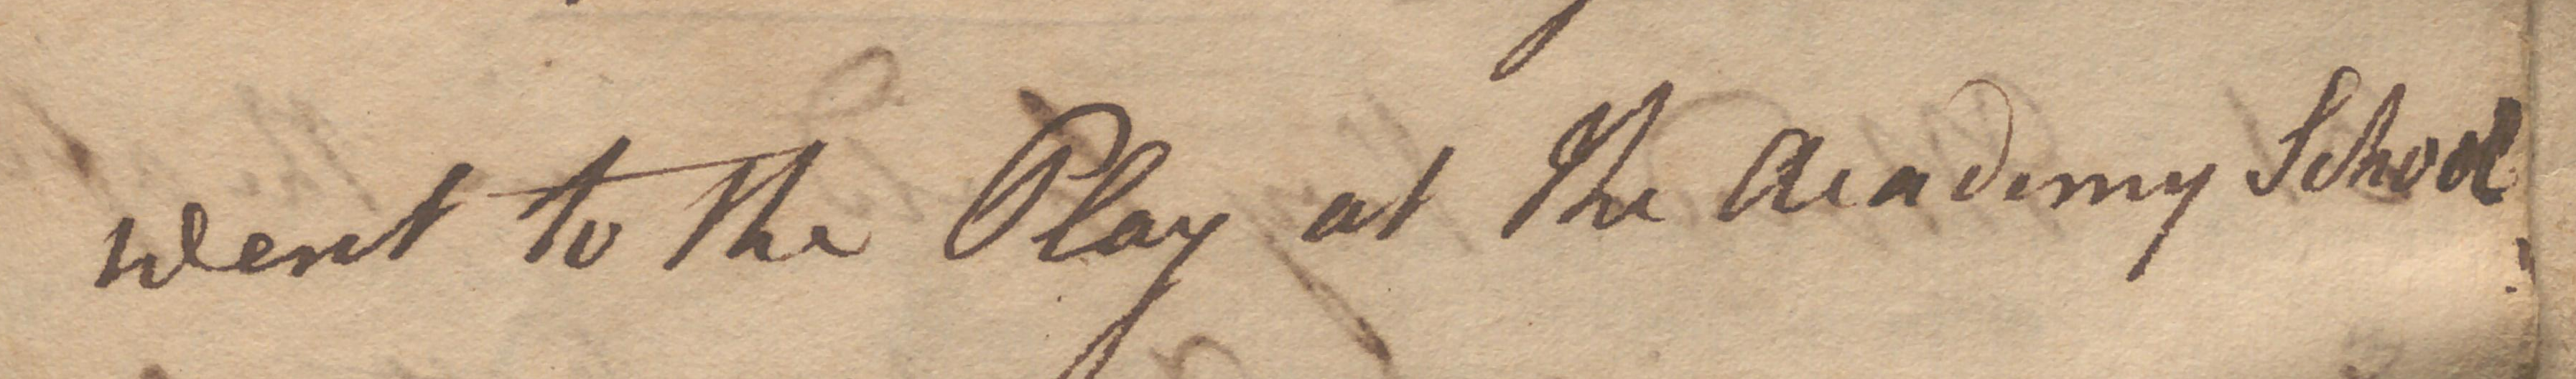went to the Play at the Academy School
